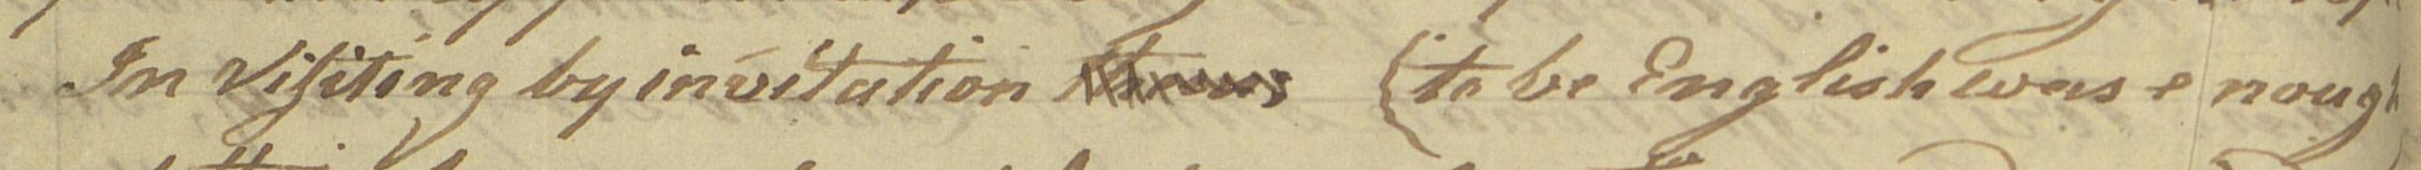In Visiting by invitation these (to be English was enough
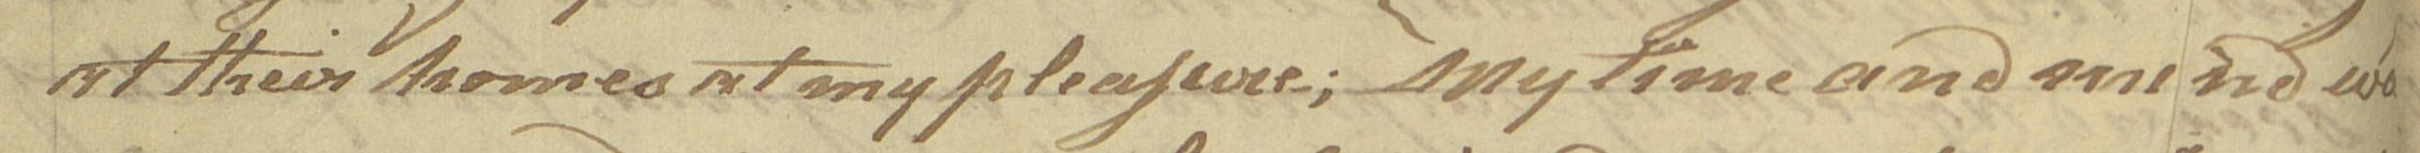at their homes at my pleasure; my time and mind wo-
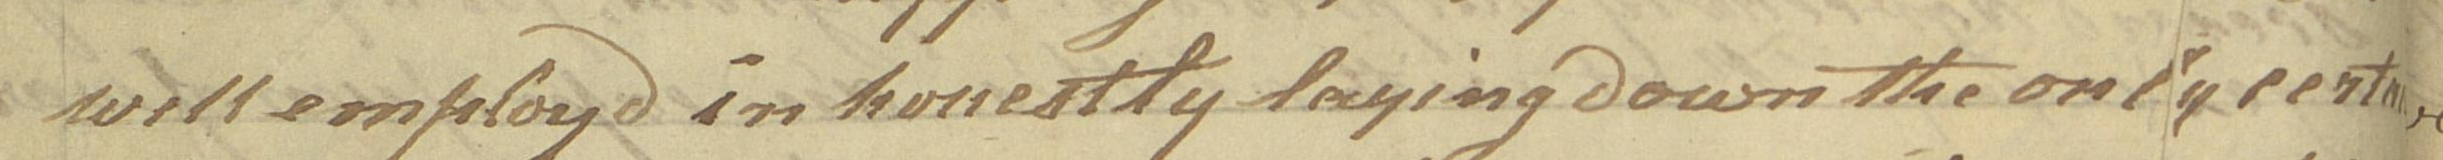well employd in honestly laying down the only certa-
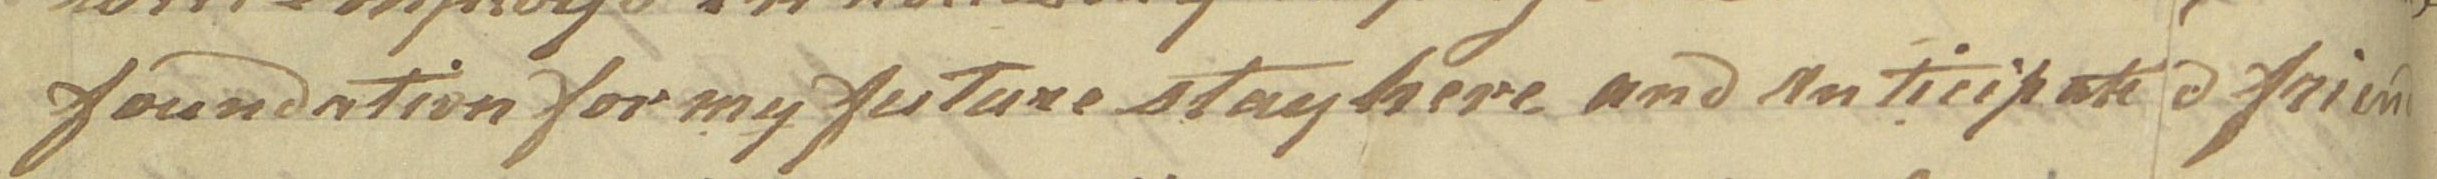foundation for my future stay here and anticipated friend
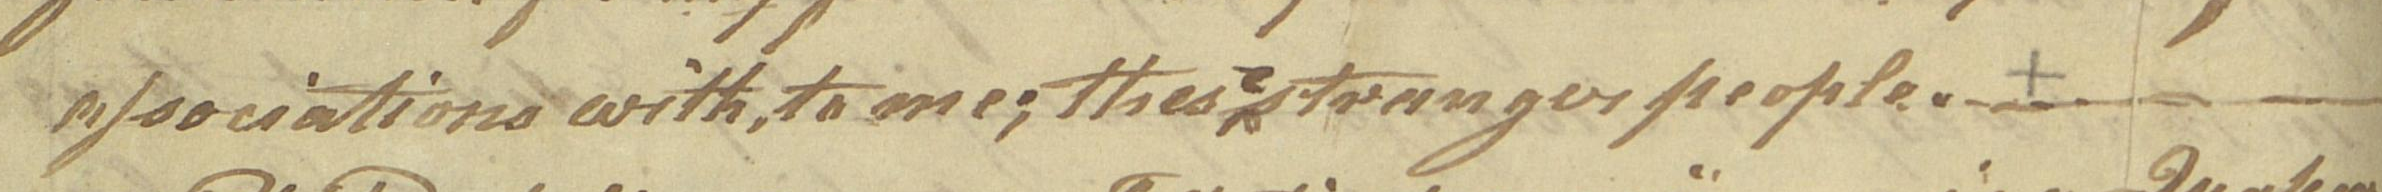associations with to me; these stranger people.
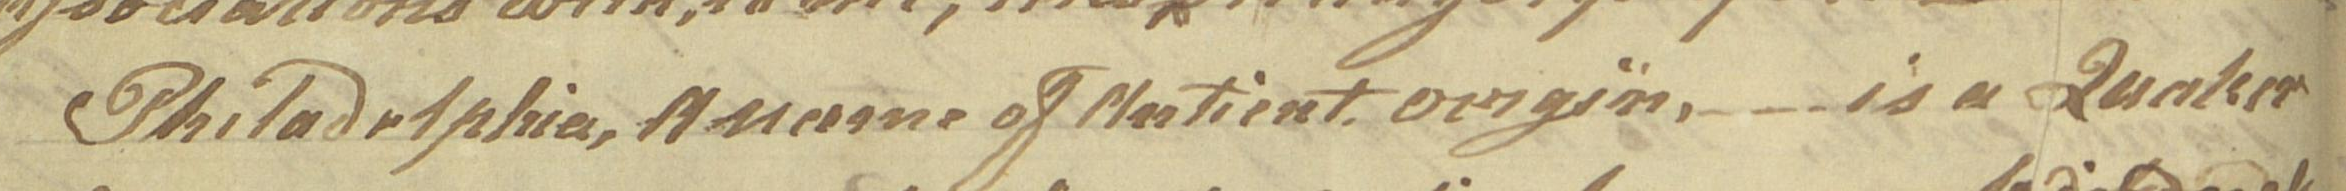Philadelphia, a name of Antient Origin, is a Quaker
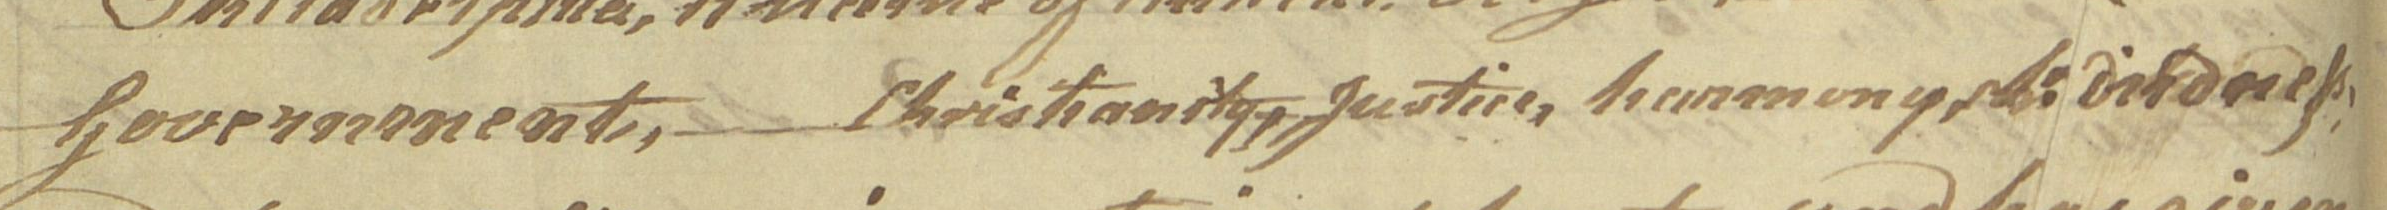Government, Christianity, justice, harmony, dirdness
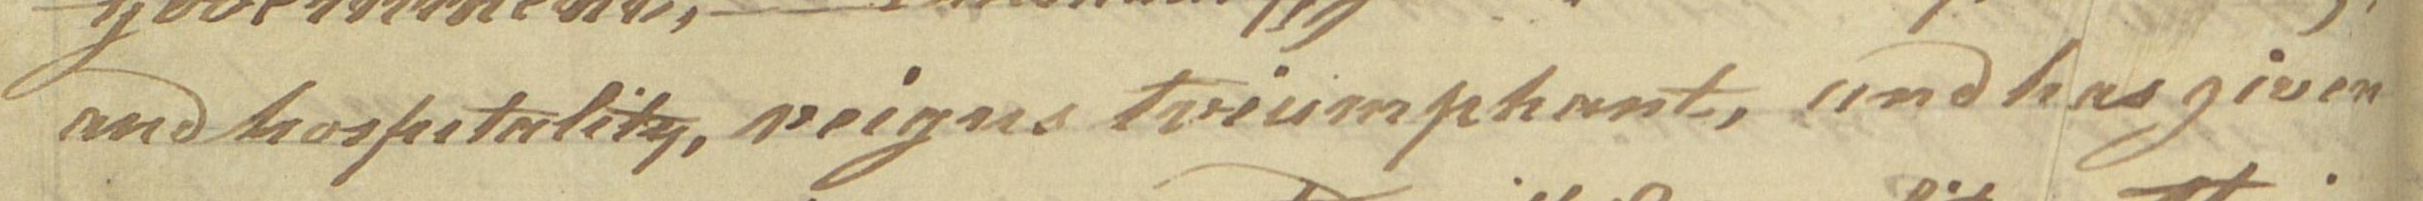and hospitality, reigns triumphant, and has given
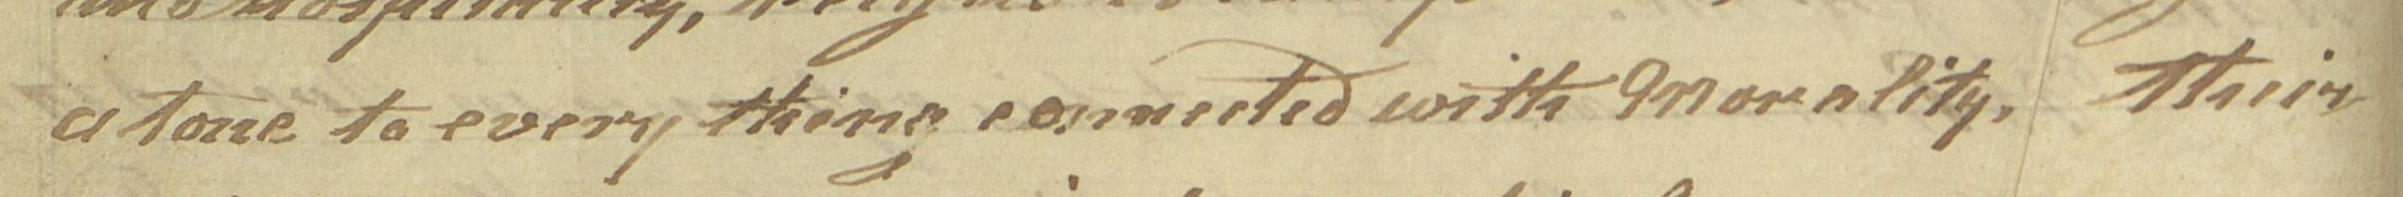a tone to every thing connected with Morality. Their
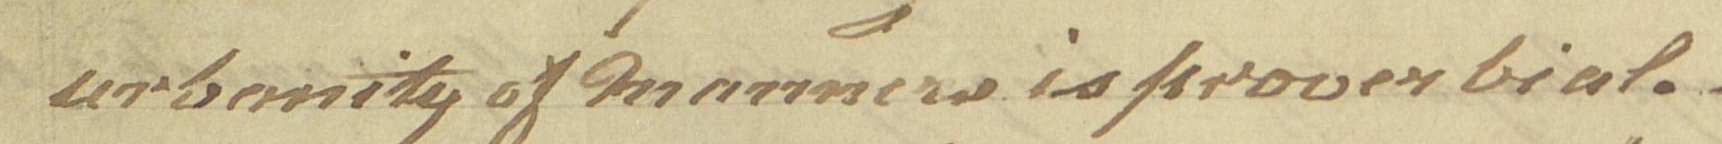urbanity of manners is proverbial.
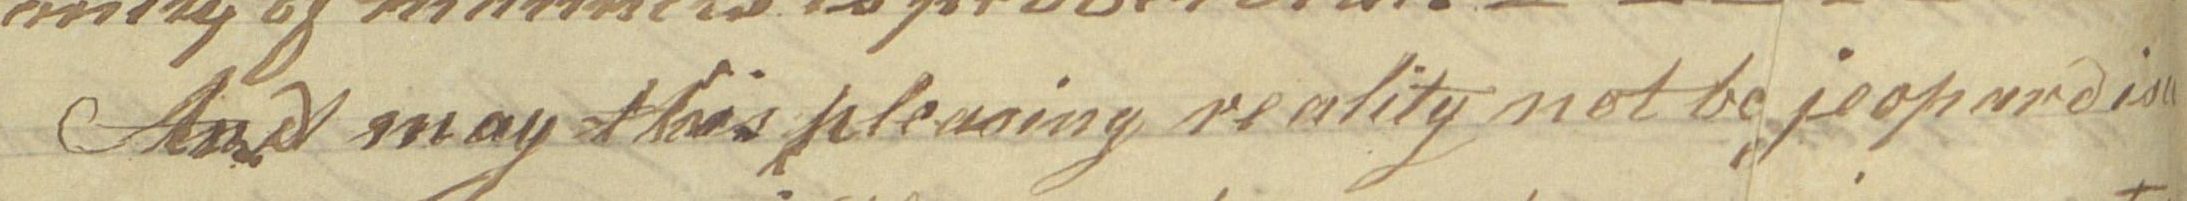And may this pleasing reality not be jeopardised
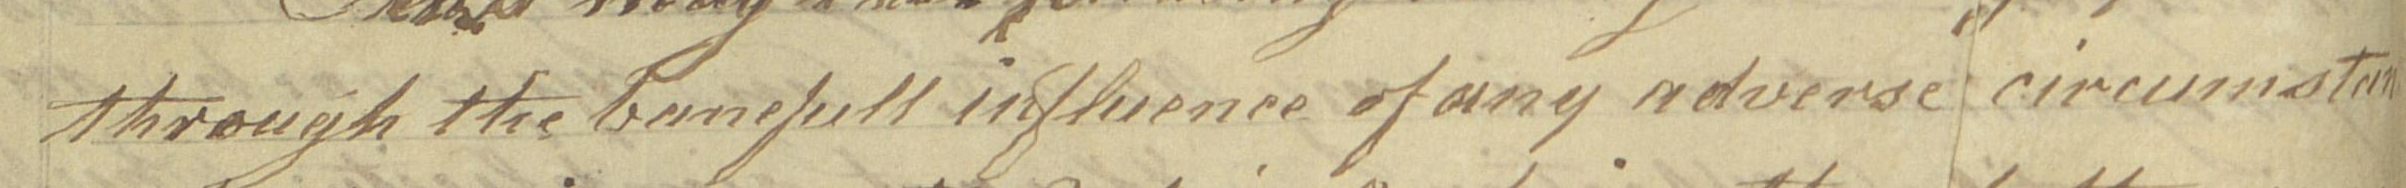through the banefull influence of any adverse circumstance
